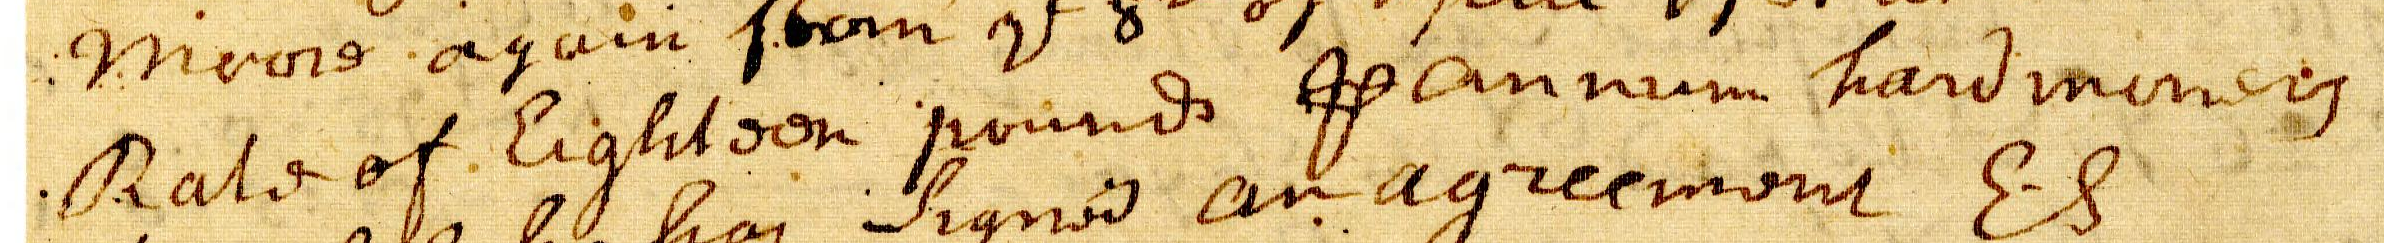Rate of Eighteen pound per Annum hard money
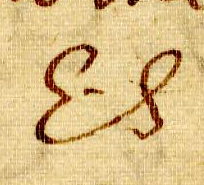E.S
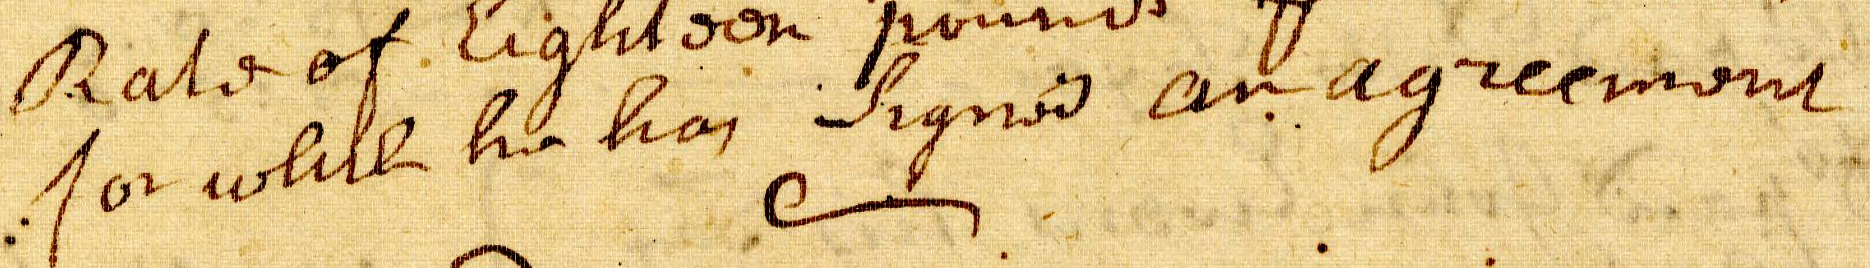for which he has Signs An agreement
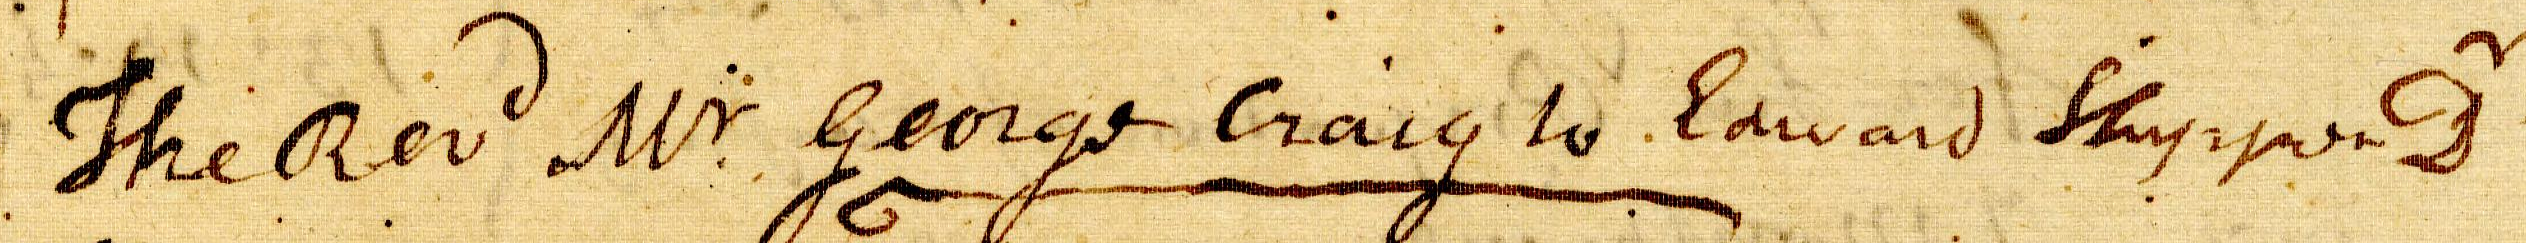The Rev^d M^r. George Craig to Edward Shippen D^r
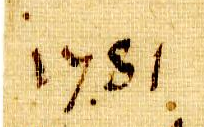1781
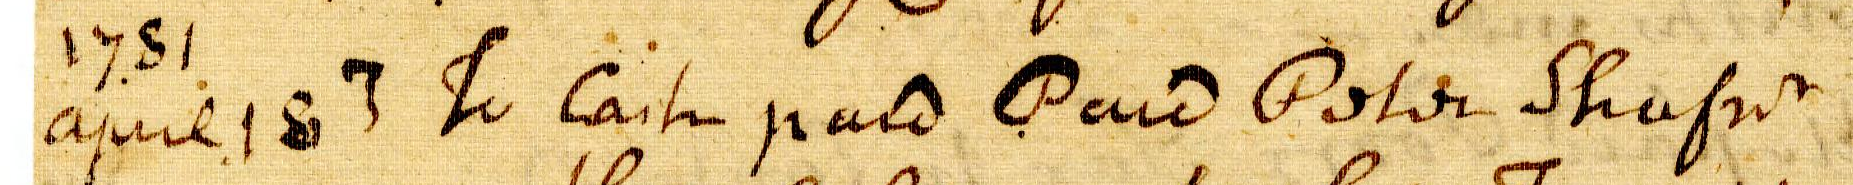April, 18 to Cash paid Paid Peter Shafn^r
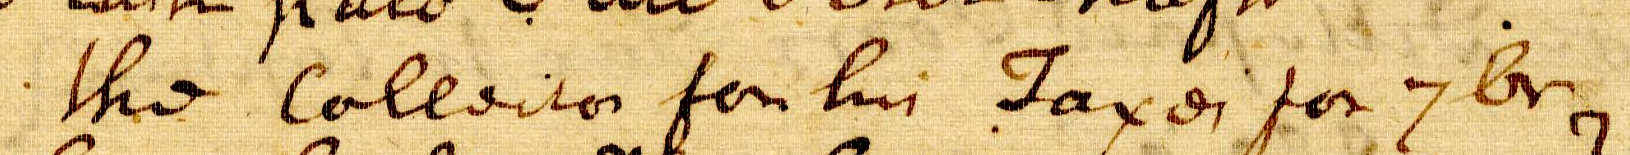the Collector for his Taxes for 7 br
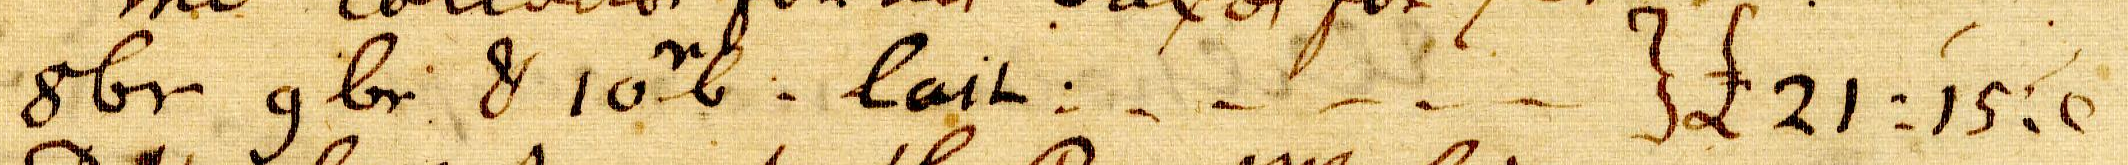8br 9br & 10^rb. last:...... £21:15:0
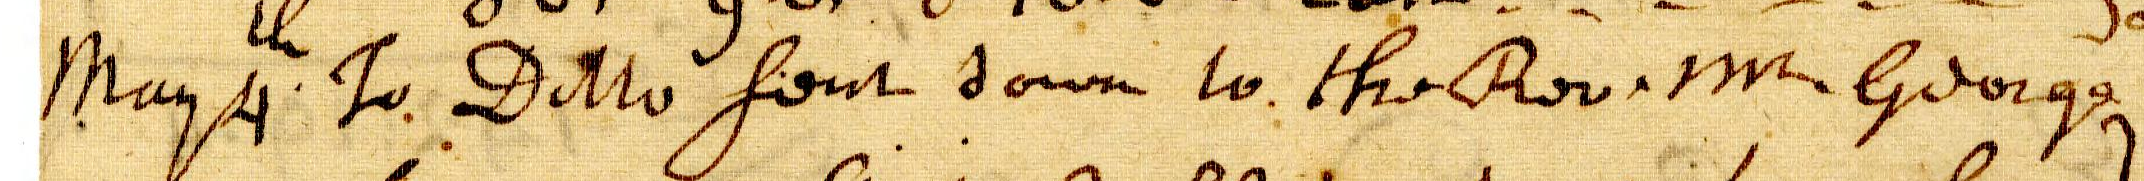May 4^th To Ditto sent down to the Rev^: M^r. George
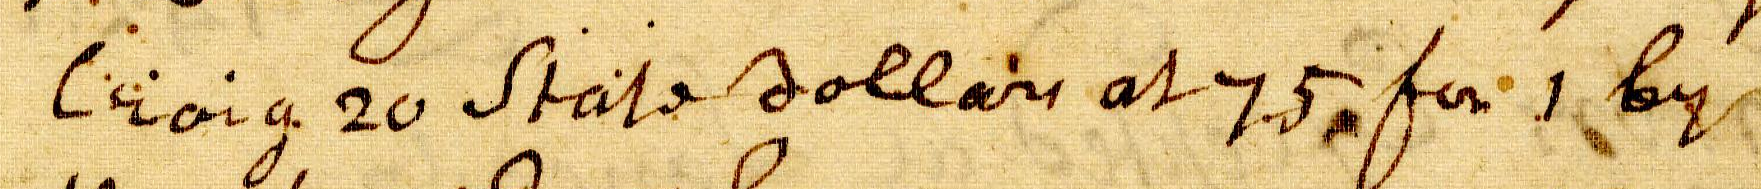Craig 20 State dollars at 75 for 1 by
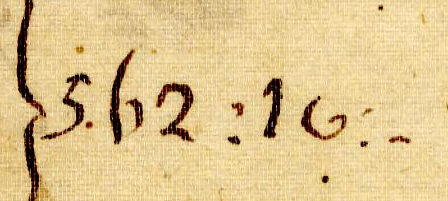562:16:.
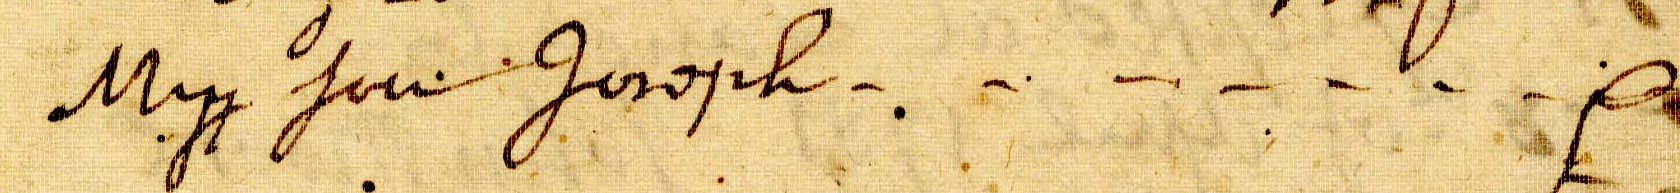My Son Joseph.......
